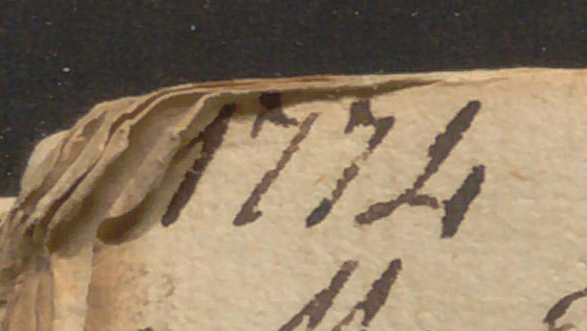1774
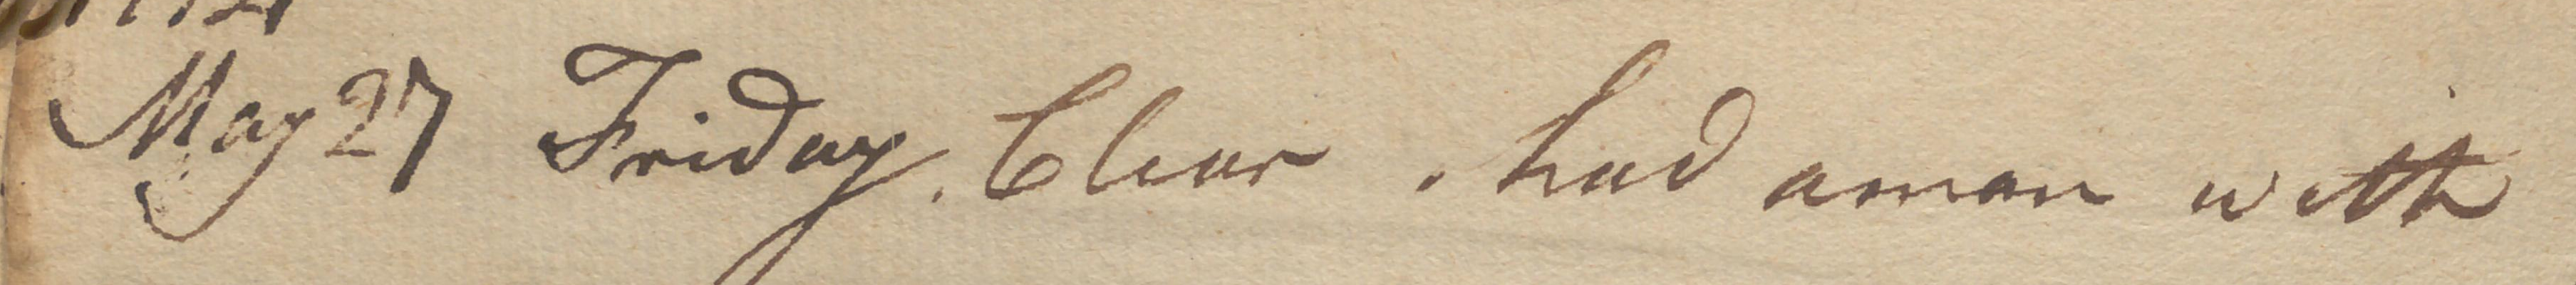May 27 Friday, Clear, had a man with
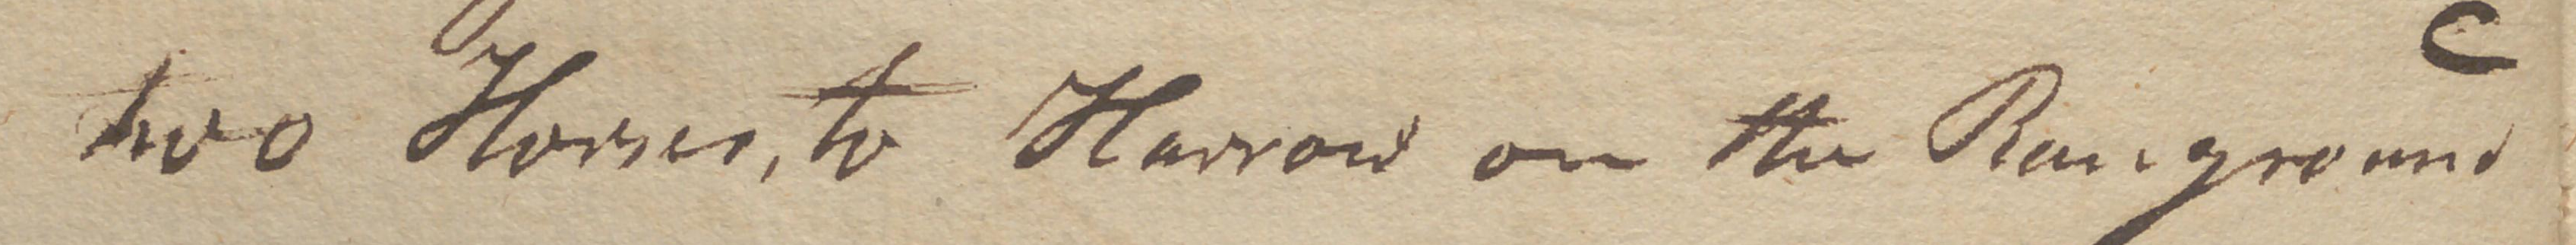two Horses to Harrow on the Race ground
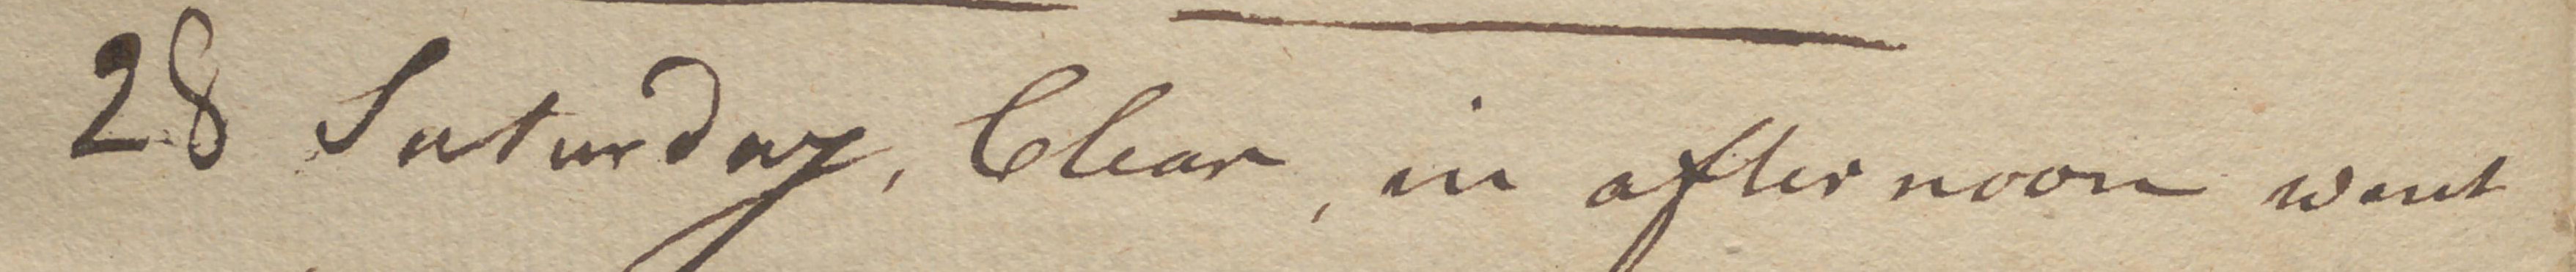28 Saturday, Clear in afternoon went
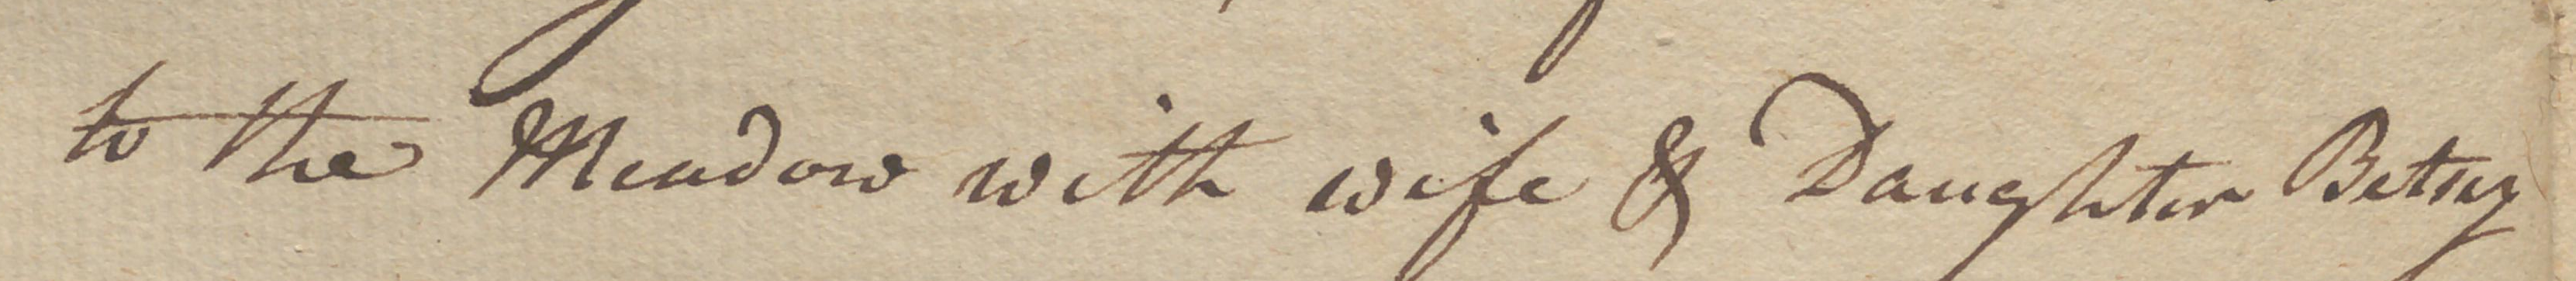to the Meadow with wife & Daughter Betsey
